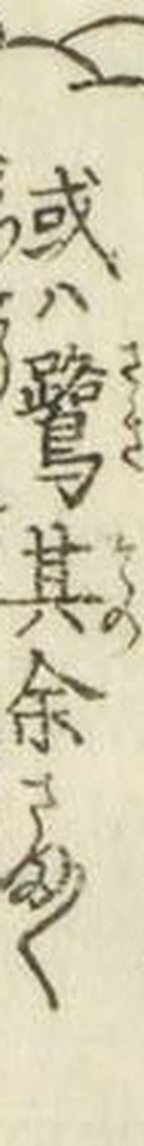或は鷺其余さま〳〵
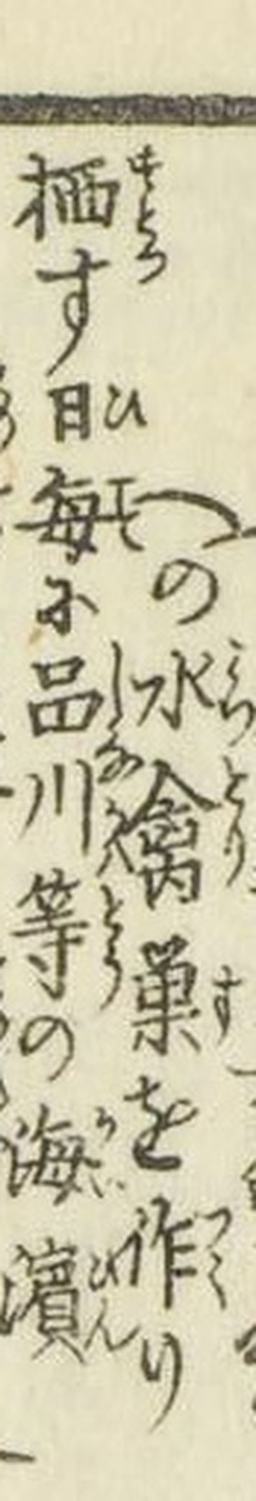栖す日毎に品川等の海浜
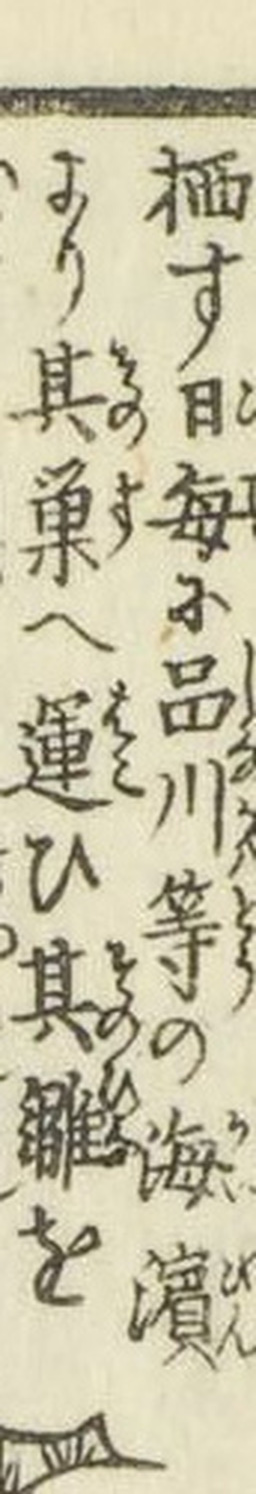より其巣へ運ひ其雛を
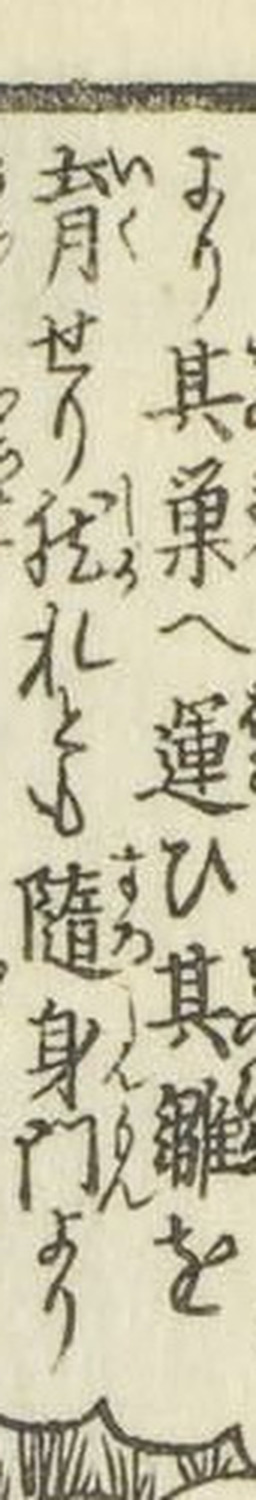育せり然れとも随身門より
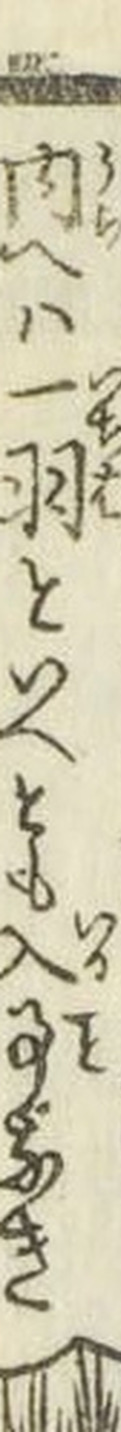内へは一羽といへとも入事なき
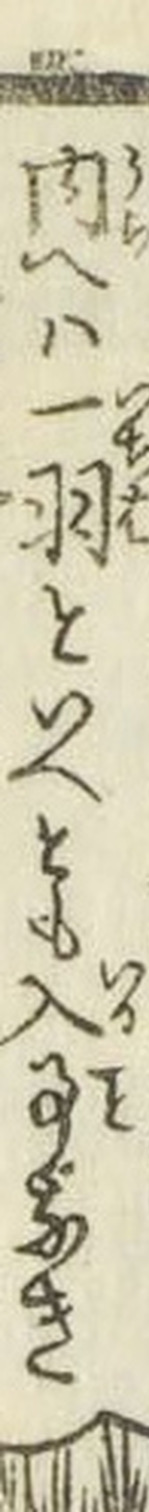内へは一羽といへとも入事なき
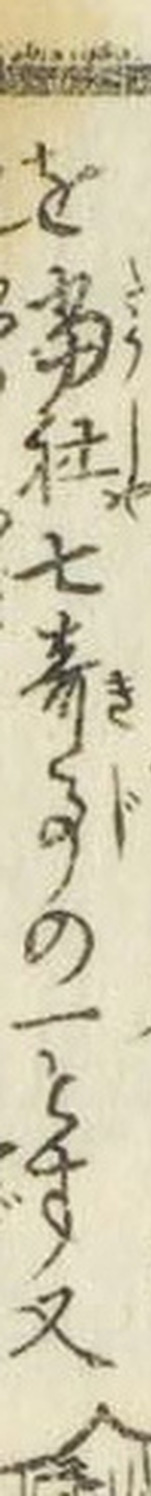を当社七奇事の一とす又
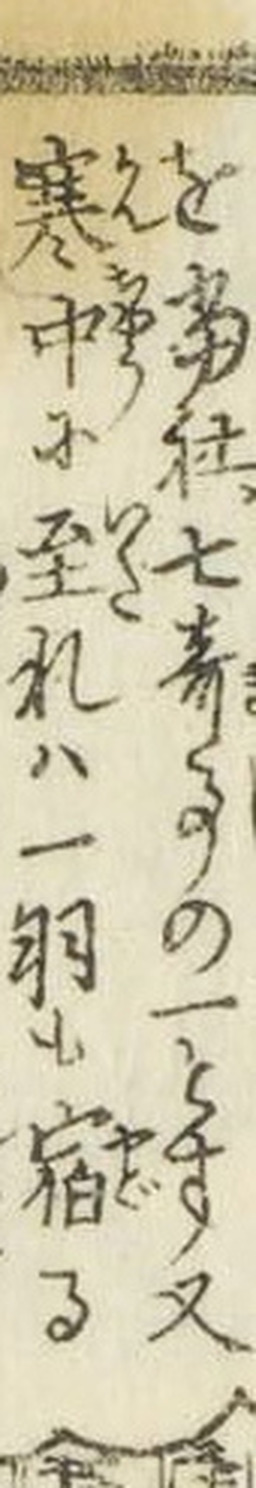寒中に至れは一羽も宿る
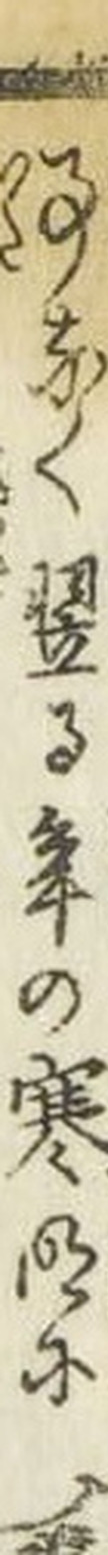事なく翌る年の寒明に
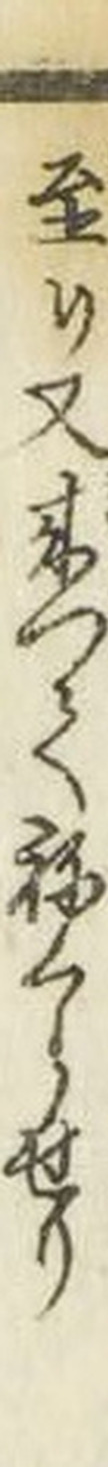至り又来つてねくらせり
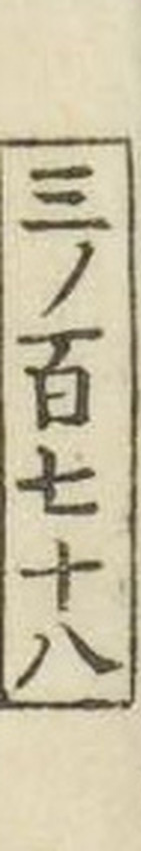三ノ百七十八
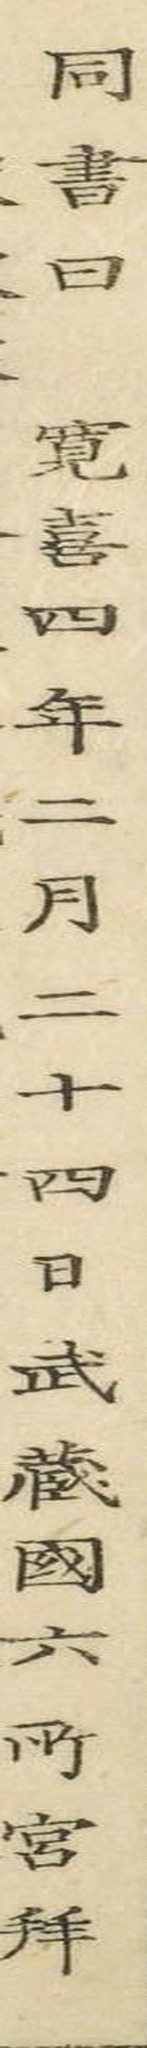同書曰寛喜四年二月二十四日武蔵国六所宮拝
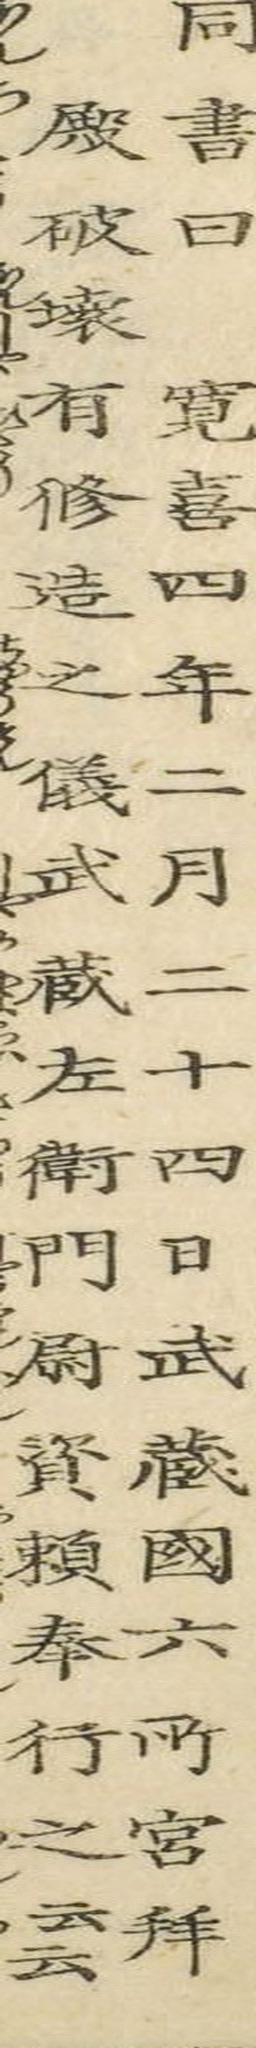殿破壊有修造之儀武蔵左衛門尉資頼奉行之云々
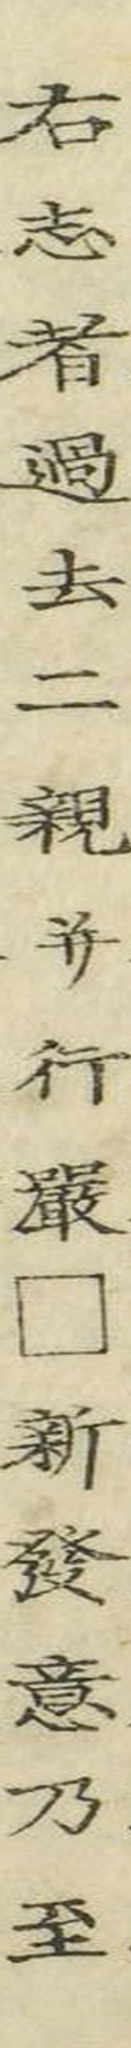右志者過去二親并行巌▢新発意乃至
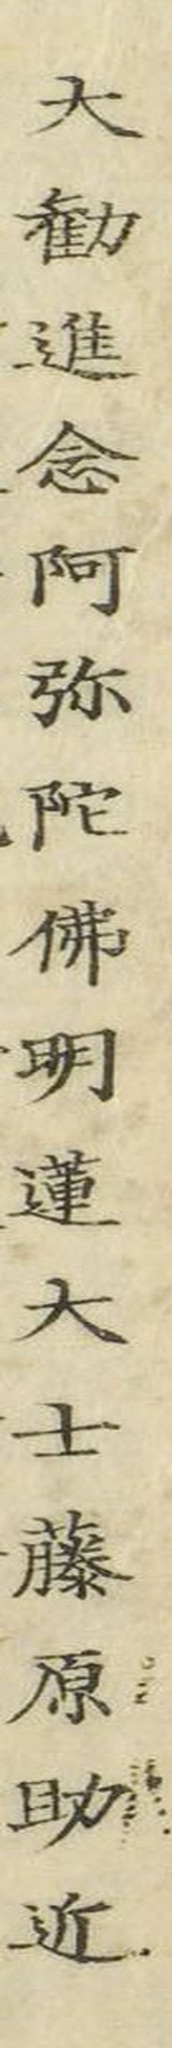大勧進念阿弥陀仏明蓮大士藤原助近
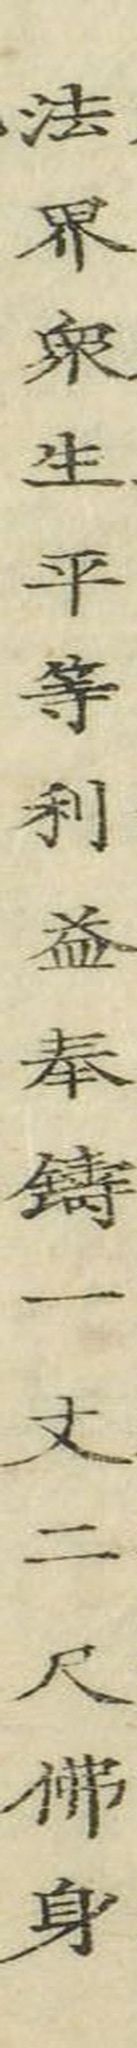法界衆生平等利益奉鋳一丈二尺仏身
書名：江戸名所図会 20巻 巻之10
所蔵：東京学芸大学教育コンテンツアーカイブ
